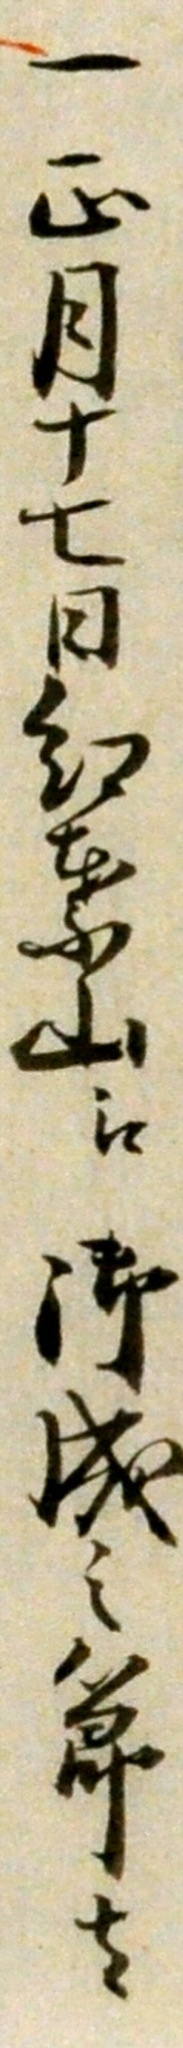一正月十七日紅葉山え御成之節は
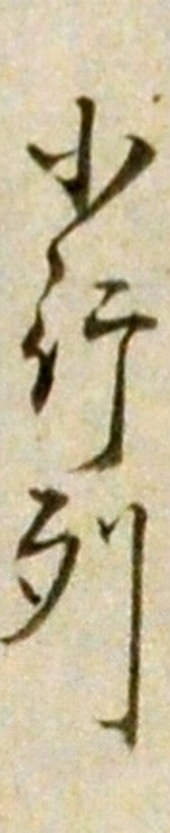小行列
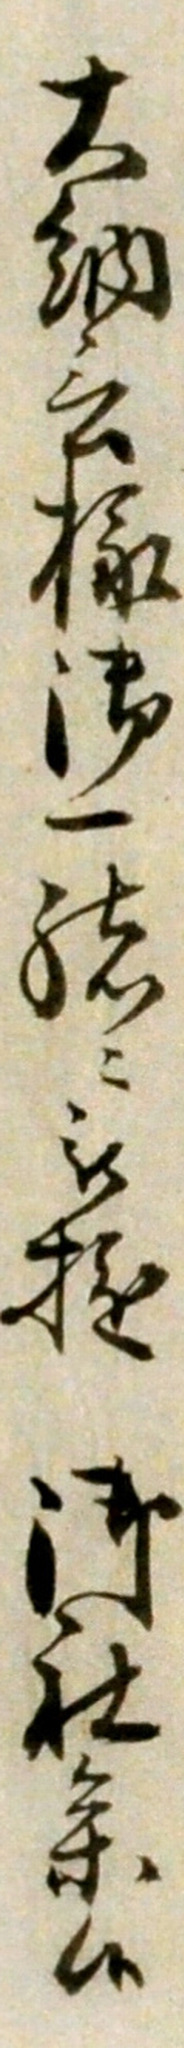大納言様御一緒に被遊御社参候
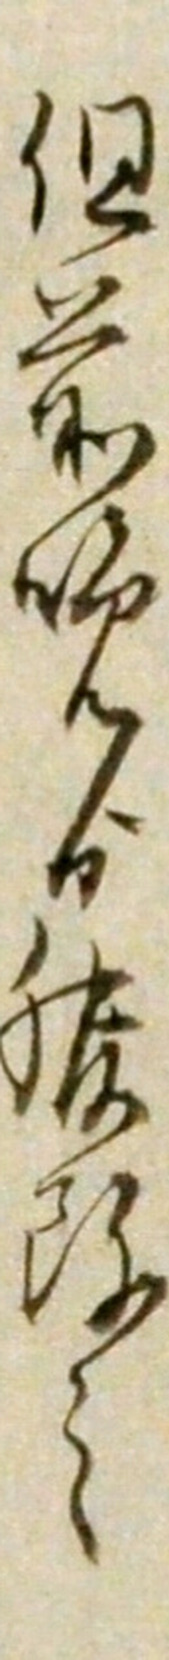但前晩ゟ服改之
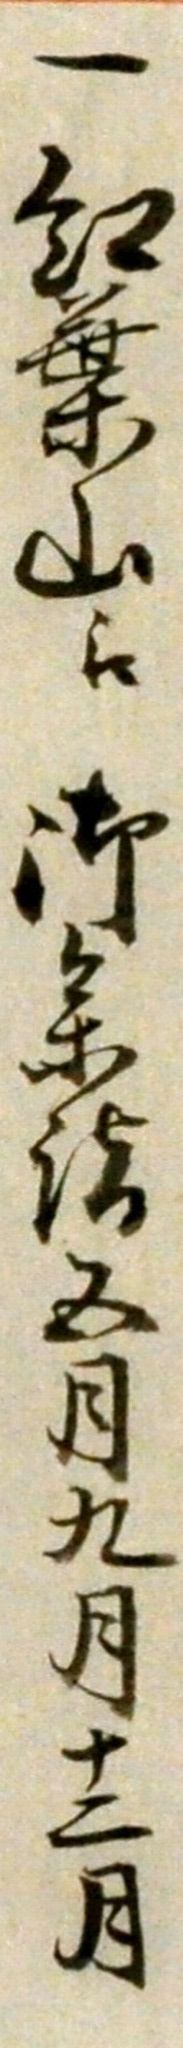一紅葉山え御参詣五月九月十二月
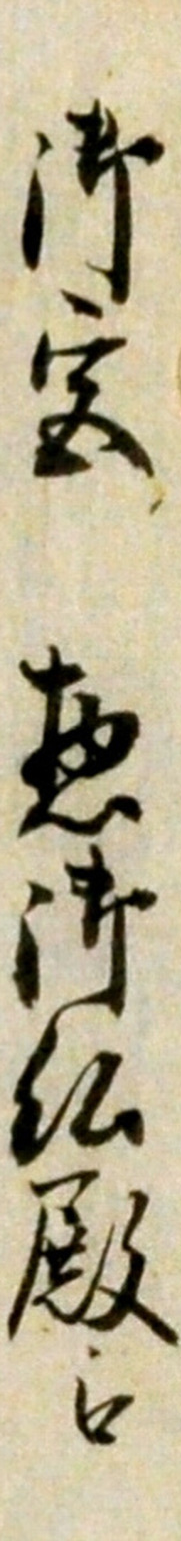御宮惣御仏殿え
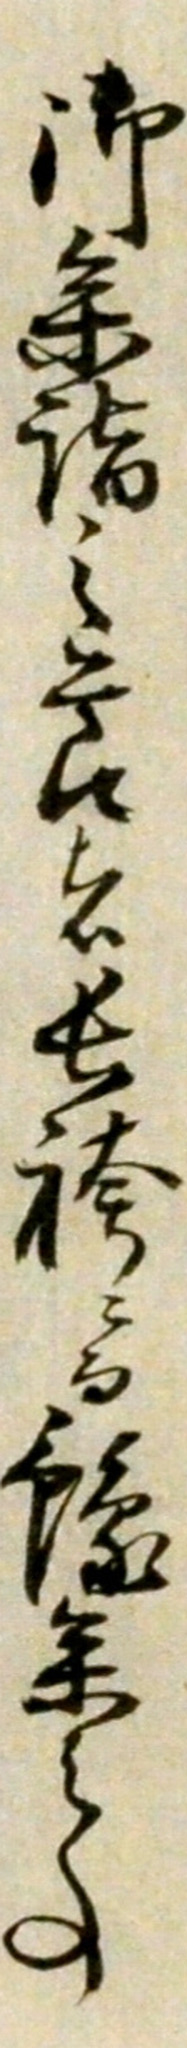御参詣之節は長袴にて予参之事
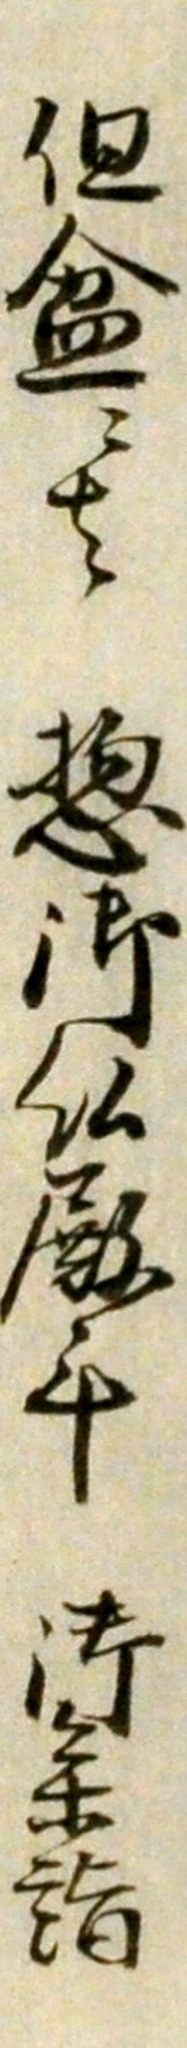但盆には惣御仏殿斗御参詣
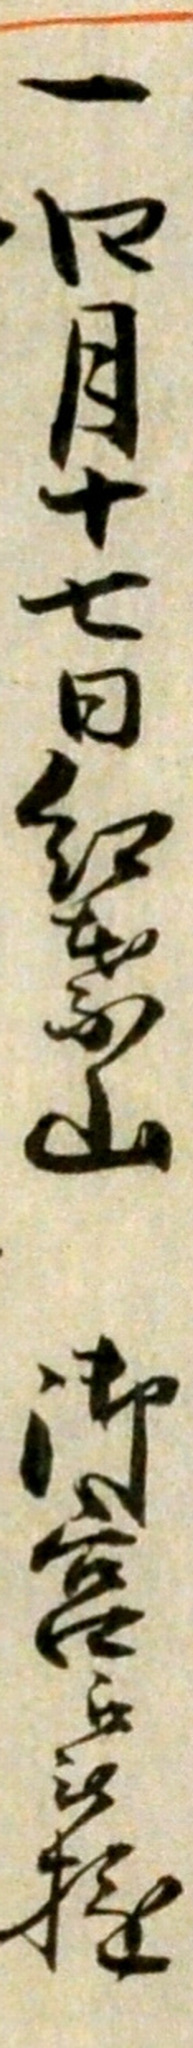一四月十七日紅葉山御宮え被遊
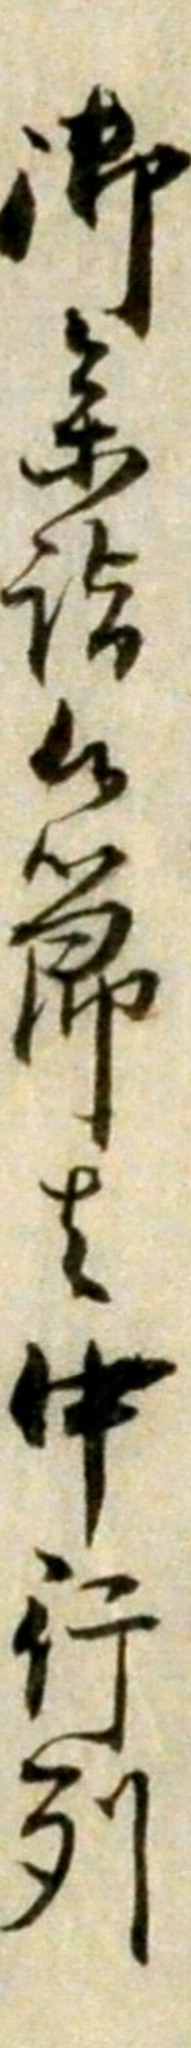御参詣候節は中行列
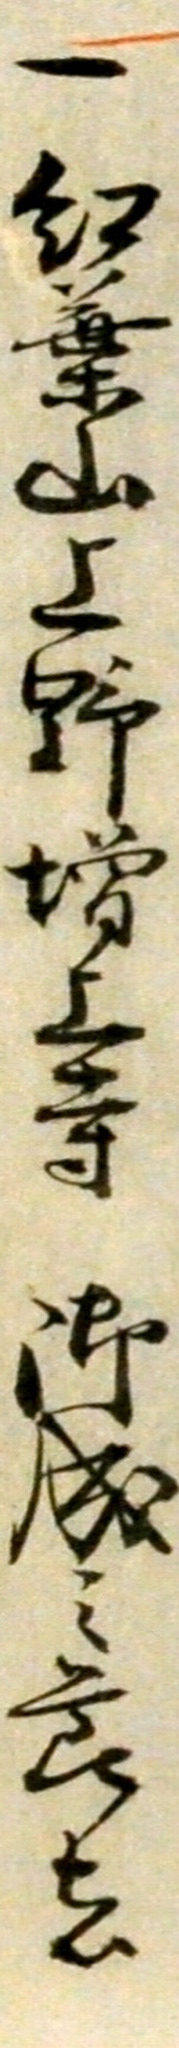一紅葉山上野増上寺御成之節は
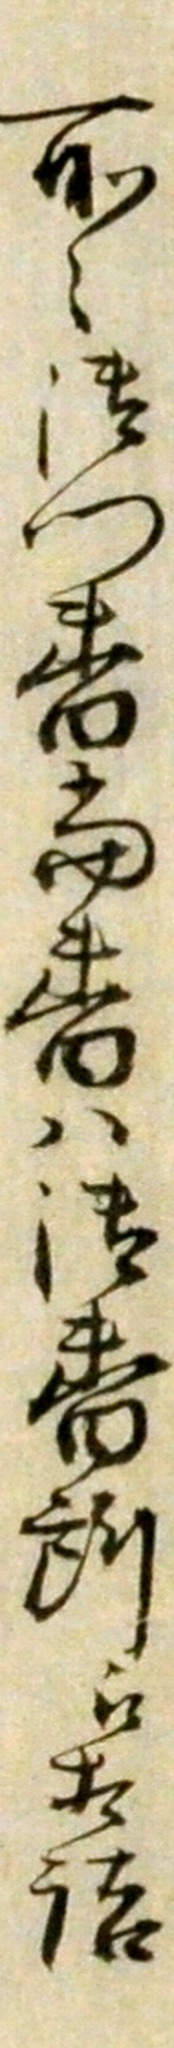所々御門番当番は御番所え相詰
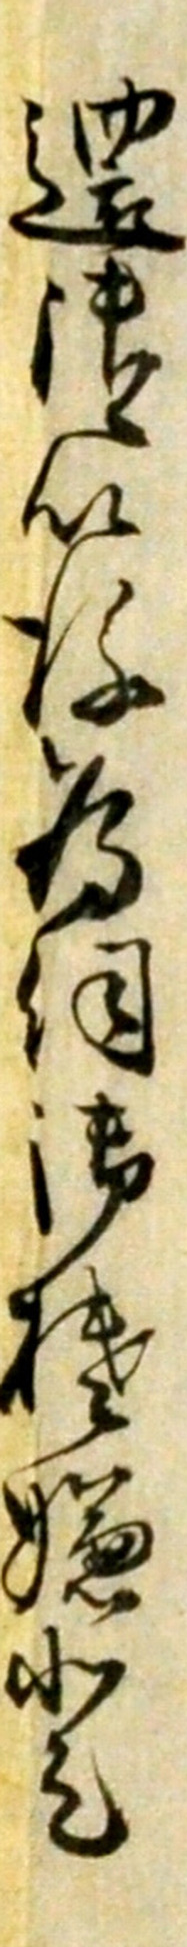還御以後為伺御機嫌登
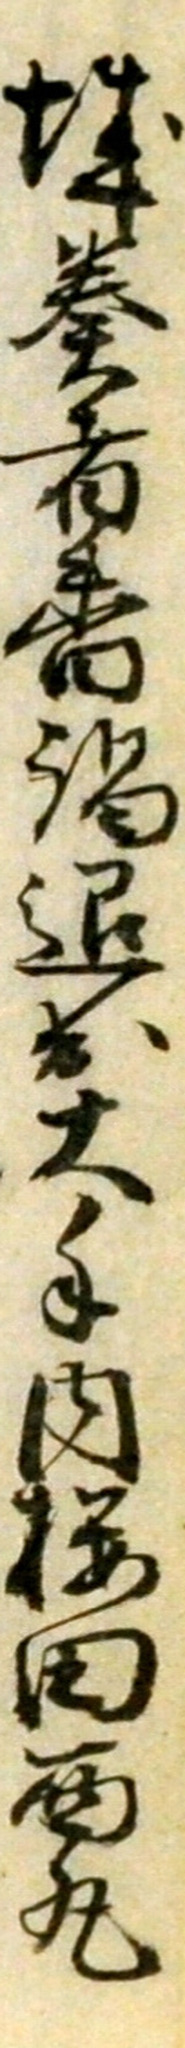城奏者番謁退出大手内桜田西丸
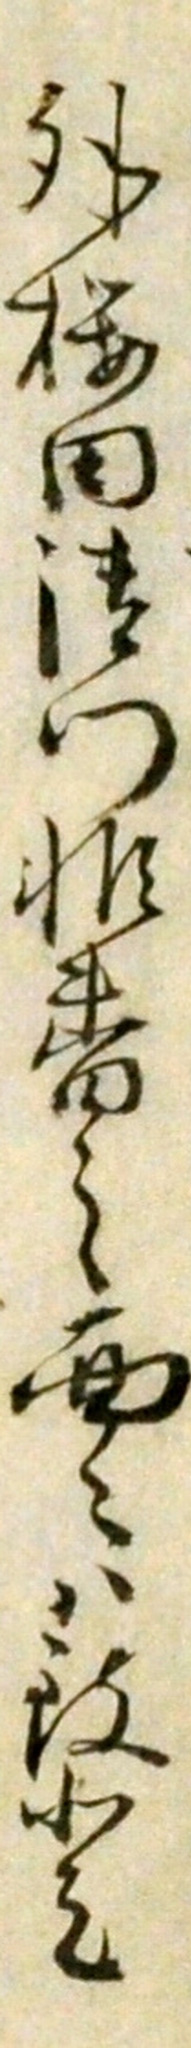外桜田御門非番之面々は致登
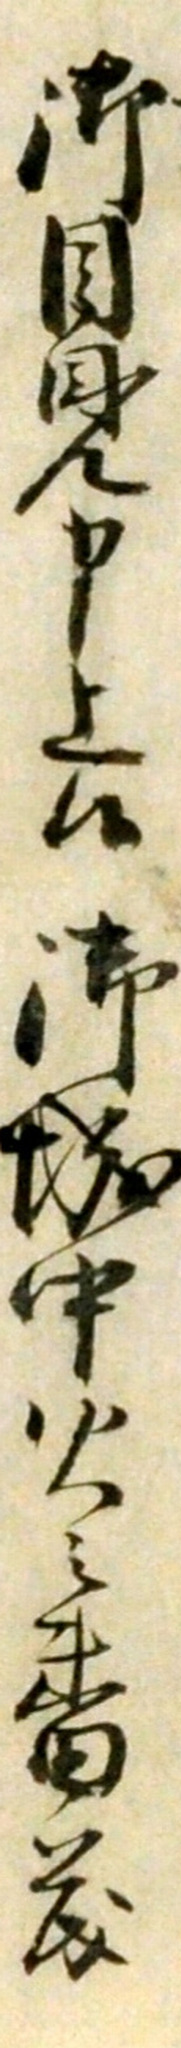御目見申上候御城中火之番も
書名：申合帳〔一括〕
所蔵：伊那市立高遠町図書館・合同会社AMANE
